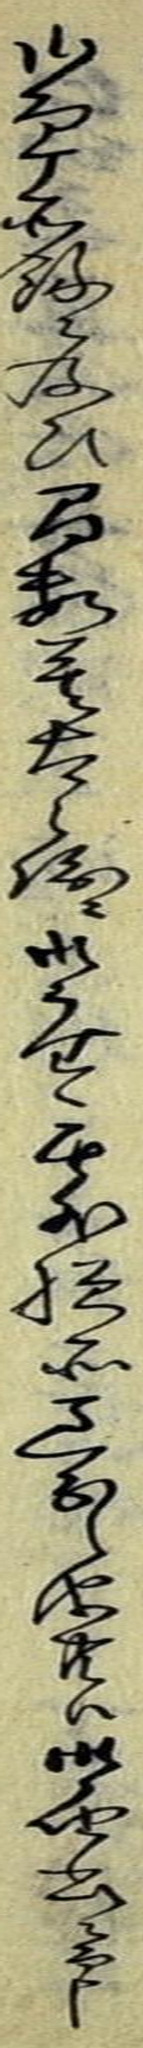弐百ヶ所餘に及ひ間数莫太之儀に御座候其外損所過分之儀共候御届書に而申
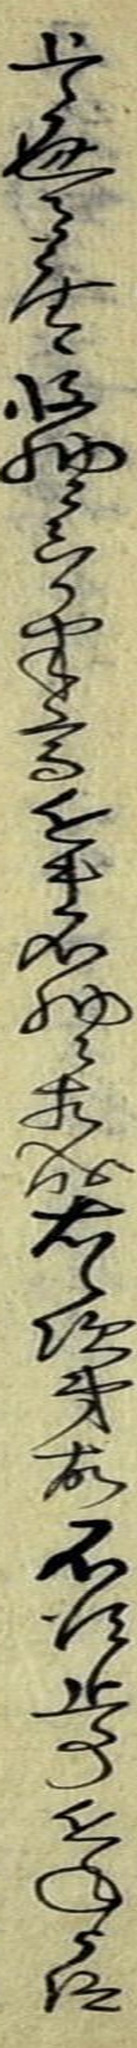上候通に御座候収納に至り半高近キ不納に相成右之次第故不得止事近年被仰
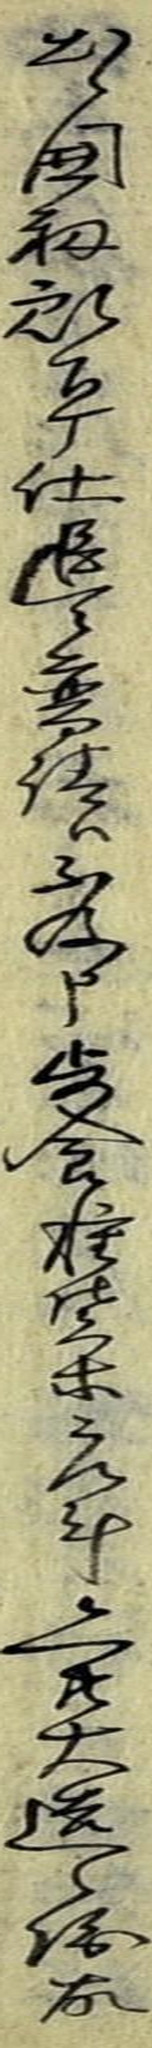出候囲籾願下ヶ仕追々普請は不及申歩金種貸等取斗候へ共大造之儀故
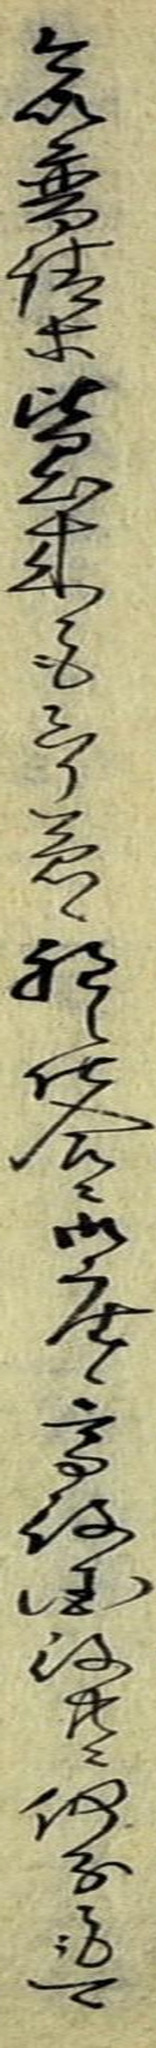今以普請等皆出来にも至り兼候程之仕合に御座候高役国役共に何分にも可
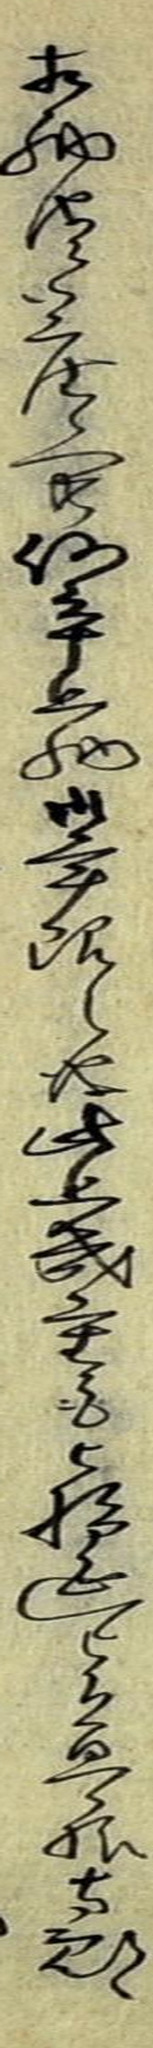相納儀に御座候へ共何卒上納御年限之儀此上幾重にも被指延被下置候様専願候
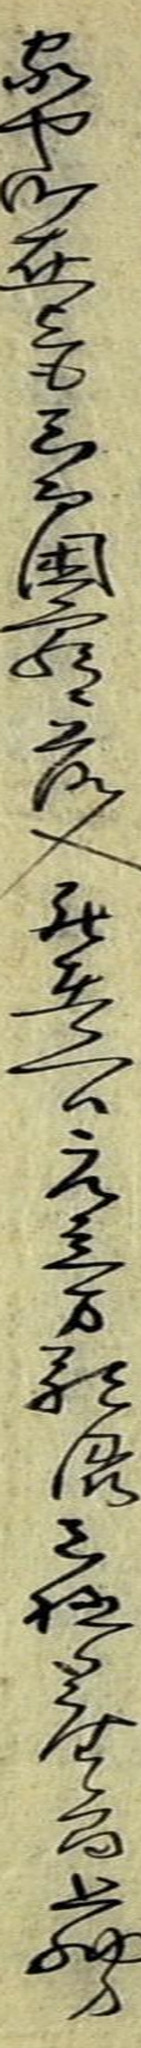家中町在迄も至而困窮に落入罷在候へは取立方難渋至極御座候間上納方
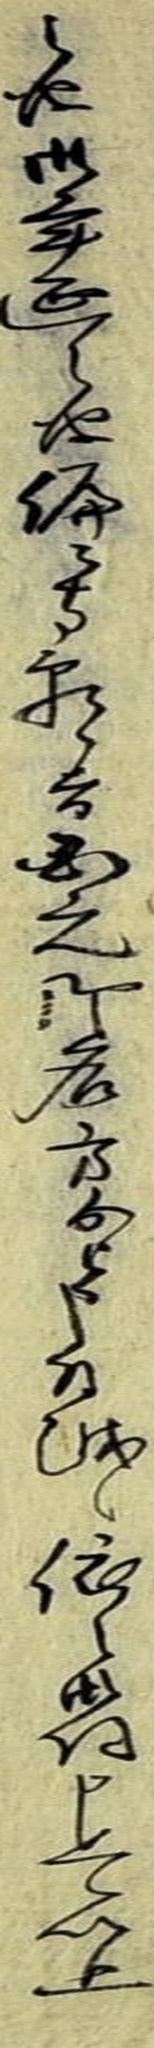之儀御年延之儀偏に専願候旨国元御名方ゟ被申付越候依之御伺申上候以上
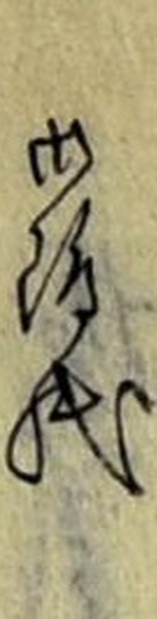御附紙
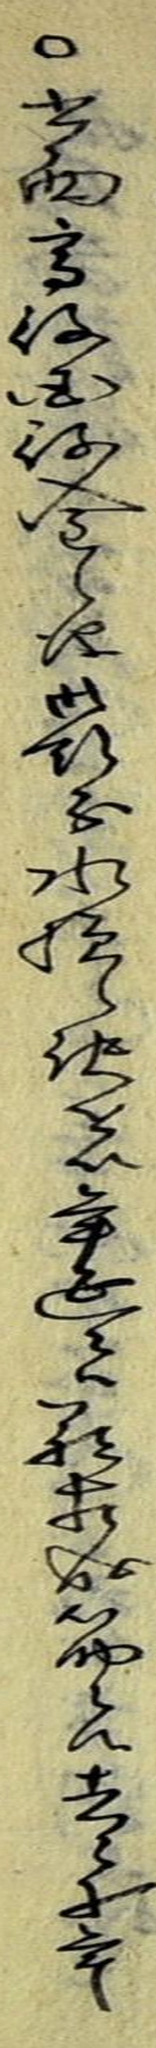○書面高役国役金之儀御領分水損之訳を以年延には難相成筋に候去々寅年

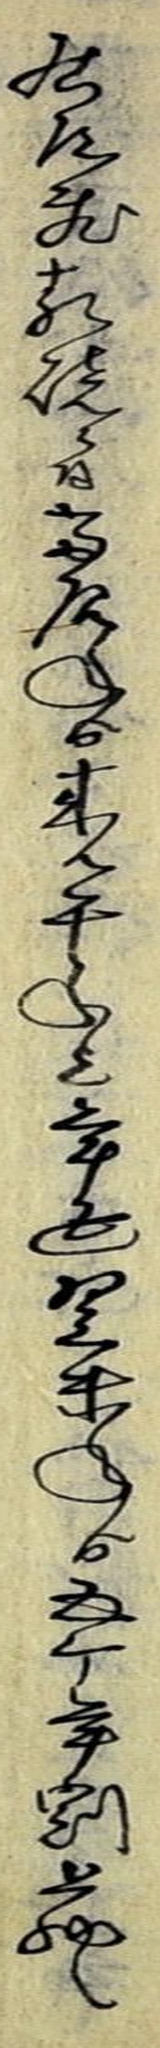居屋敷類焼に付当辰年ゟ来ル午年迄年延翌未年ゟ五ヶ年割上納之
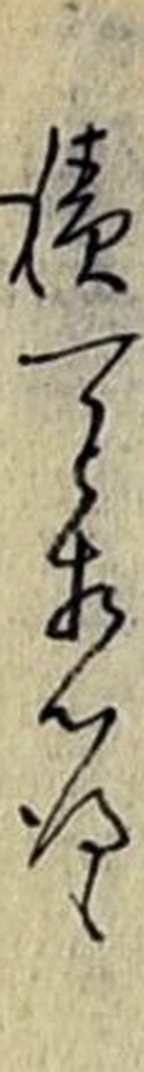積り可相心得候
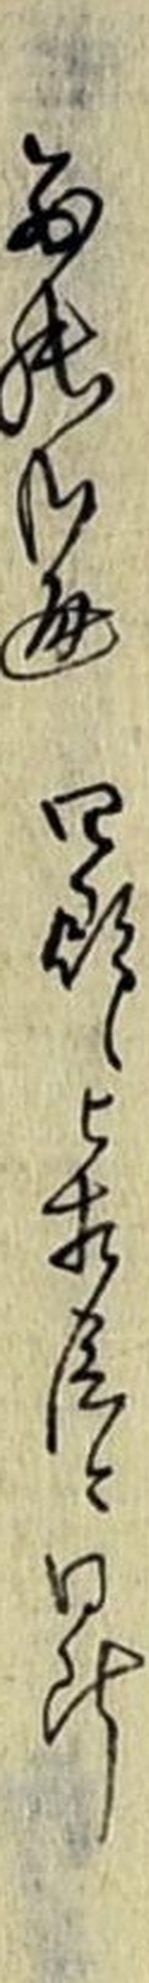別紙弐通四郡へ被相渡と同断
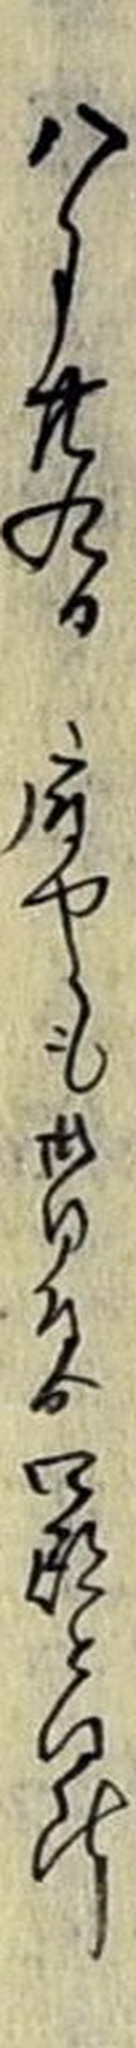八月廿九日府中へも御目付ゟ四郡と同断
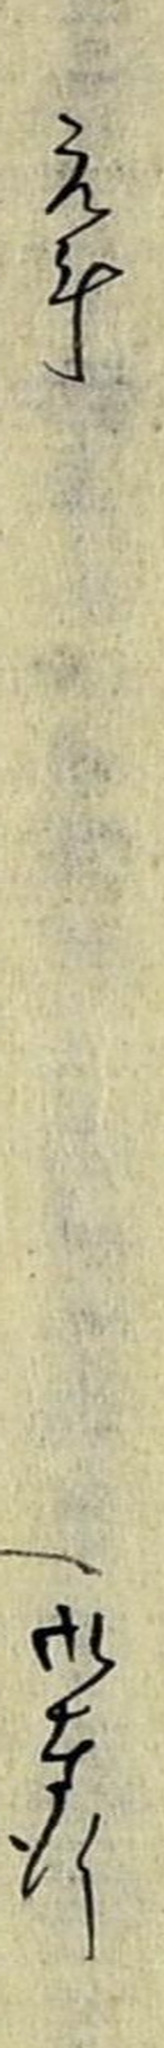取斗御奉行
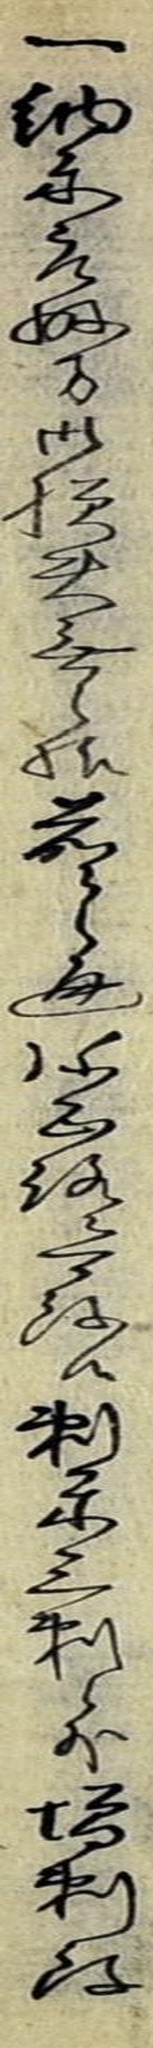一納米取扱方御損失無之様前々之通弥正路に可致候刺米三刺之外増刺致
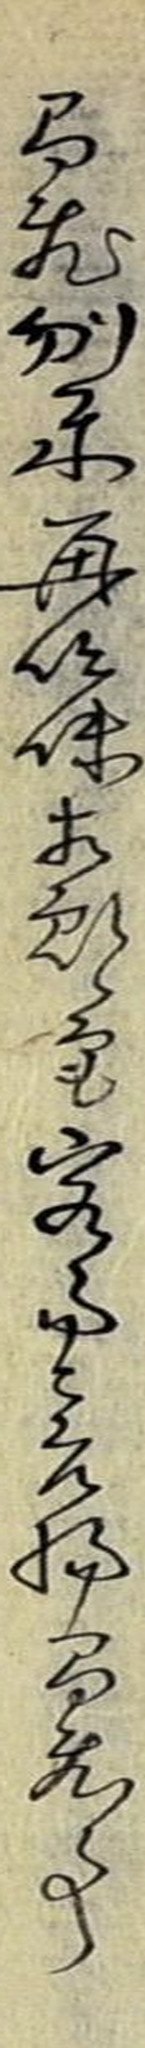間敷刎米再吟味相願候而も宥事に取揚間敷事
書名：命令之部 四
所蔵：福井県文書館 Fukui Prefectural Archives
